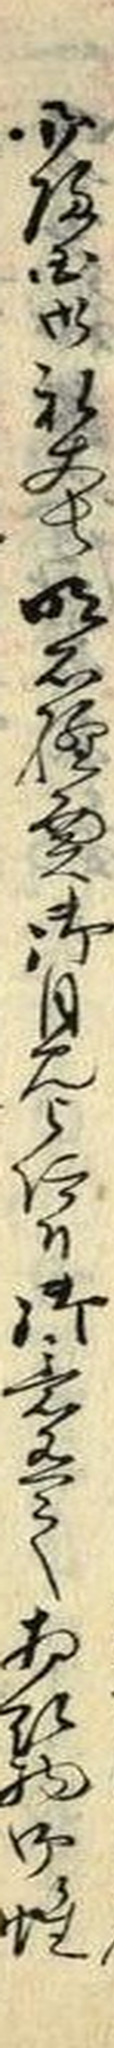御帰国御礼使者明石縫殿御目見被仰付御意有之拝領物御帷
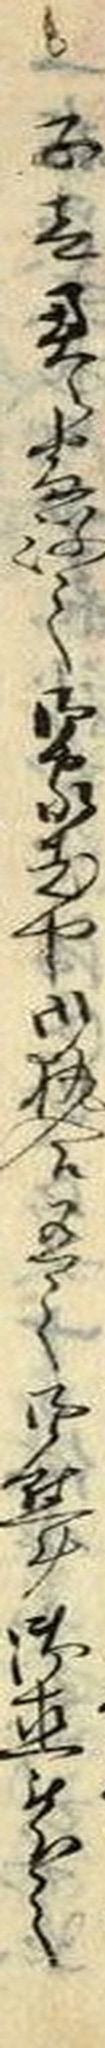子壱奥之番役之御家老中御執合有之御慰斗御直被下之
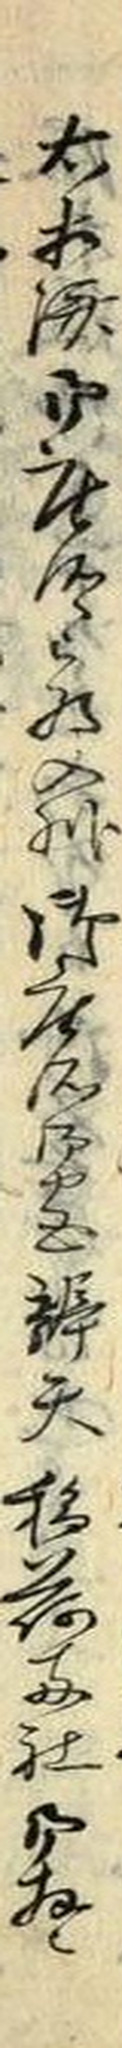右相済御座所へ被為入掛御座所御宮弁天稲荷両社御拝被
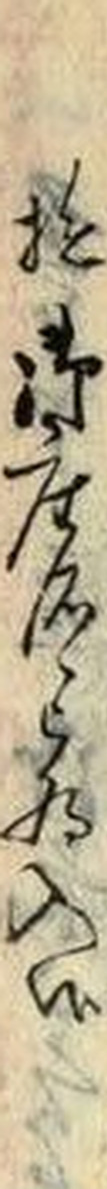遊御座所へ被為入候
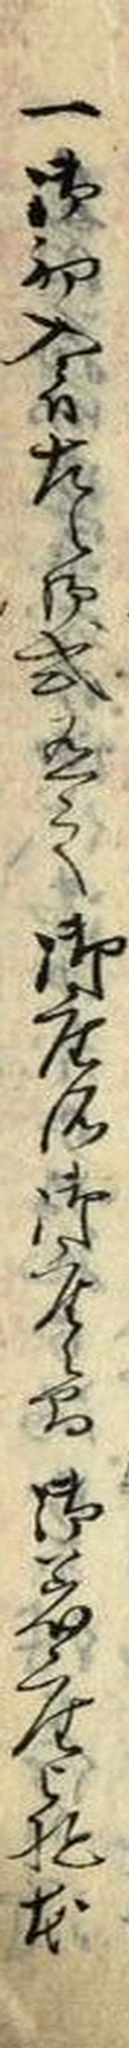一御初入ニ付左之通御式有之御座所御座之間御着座被遊本

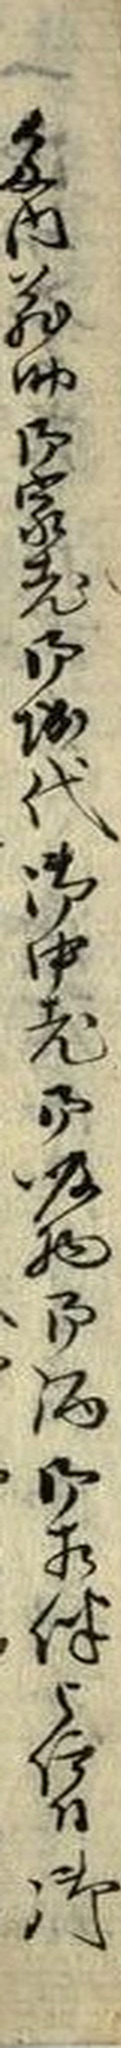多内蔵助御家老御城代御中老御吸物御酒御相伴被仰付候御
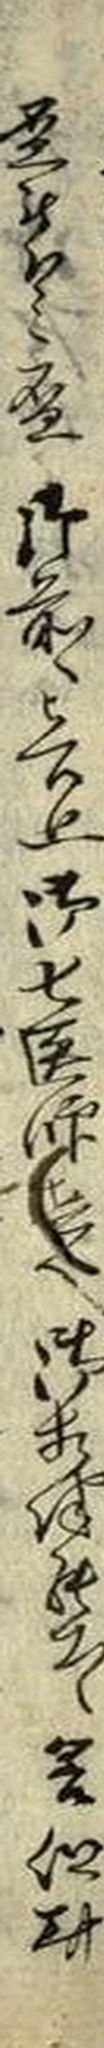盃被下之盃御前へ被召上御匕医師壱人御相伴罷出候筈但刻
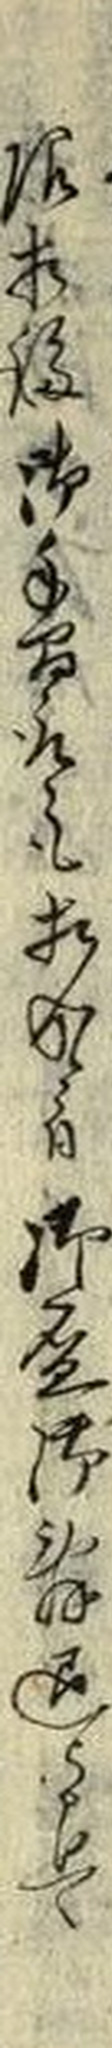限相移御手間取ニも相成候ニ付御盃御辞退被申上候
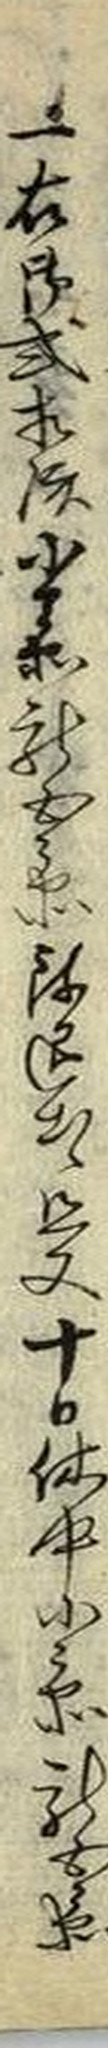一右御式相済小兵衛新五兵衛致退出候且又十日休中小兵衛新五兵衛
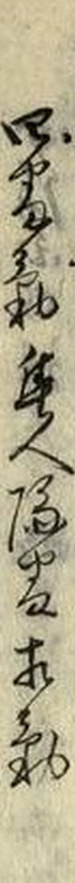四番勤隼人帰番相勤
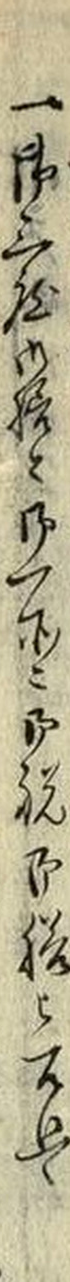一御三度御膳と御一所ニ御祝御膳被召上候
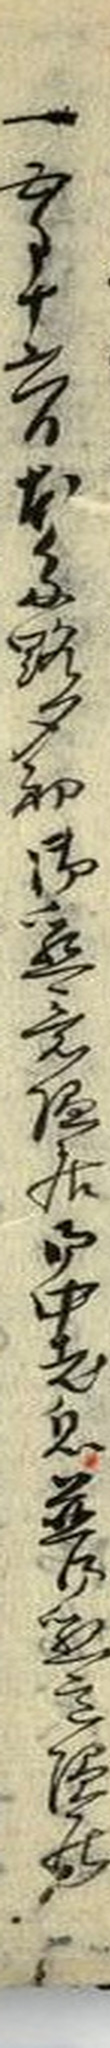一五月十六日本多路夕初御懇意隠居御中老息並御懇意隠居
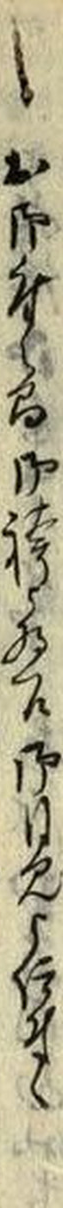於御座之間御袴被為召御目見被仰付候
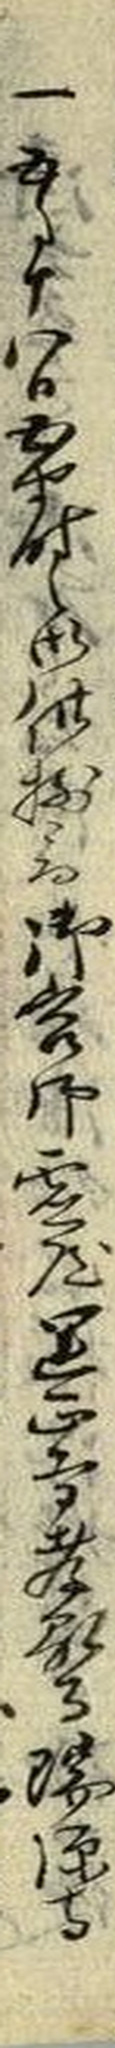一五月十八日五半時之御供揃ニ而御宮御霊屋運正寺孝顕寺瑞源寺
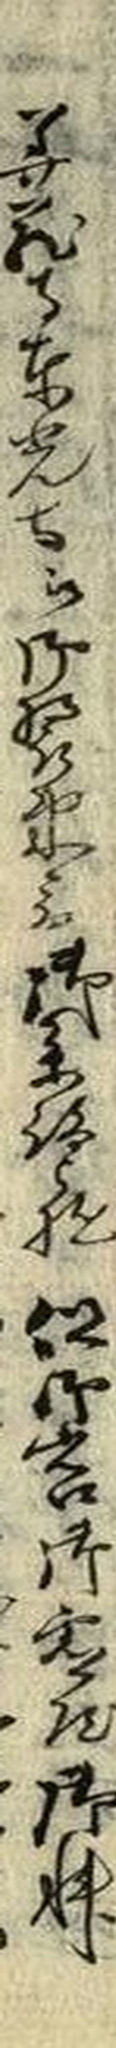華蔵寺東光寺江御装束ニ而御参詣被遊但御宮御霊屋御拝
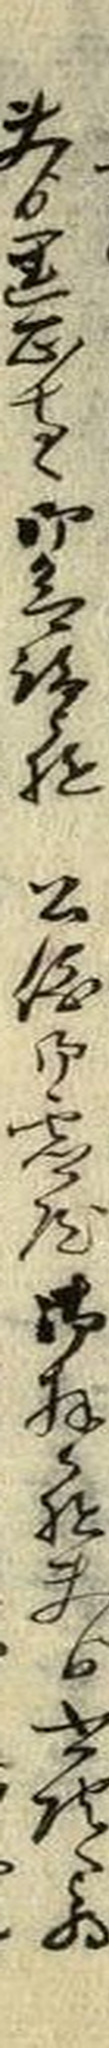夫ゟ運正寺へ御参詣被遊公儀御霊屋御拝被遊夫ゟ書院へ被為
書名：少傅日録抄（斉承付側向頭取日記、在国）
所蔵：福井県文書館 Fukui Prefectural Archives
